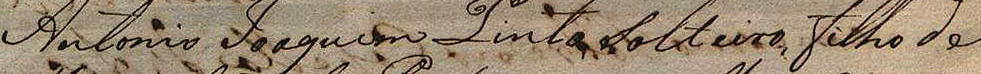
Antonio Joaquim Pinto, solteiro, filho de
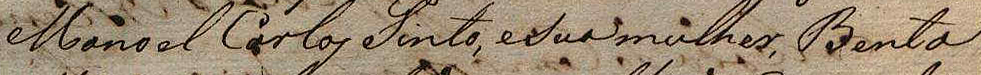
Manoel Carlos Pinto, e sua mulher, Benta
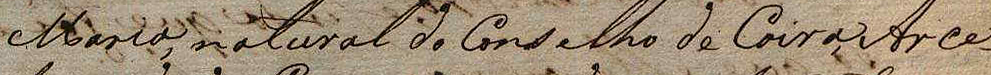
Maria, natural do Conselho de Coira Arce
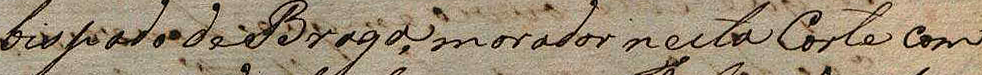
bispado de Braga, morador nesta Corte com
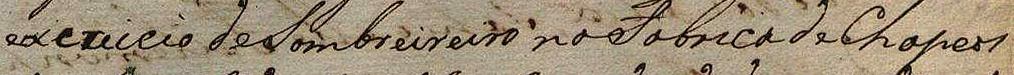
exercicio de Sombreireiro na Fabrica de Chapeos
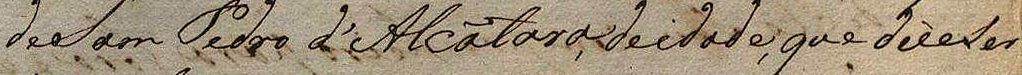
de Sam Pedro d’Alcãtara, de idade, que dice ser
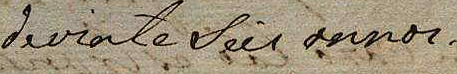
de vinte seis annos.
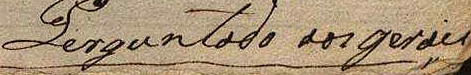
Perguntado aos gerais
